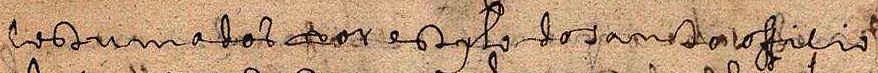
costumados por estylo do santo officio
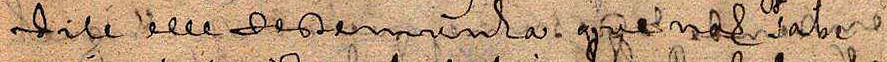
dice elle testemunha que naõ sabe
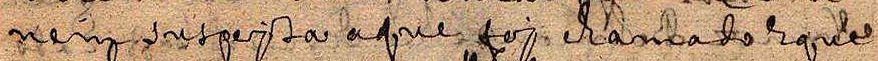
nem suspejta a que foj chamado E que
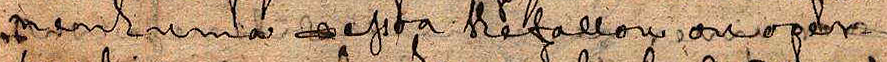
nenhuma pessoa lhe fallou ou o per
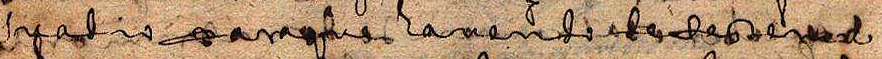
suadio para que hauendo de testemu
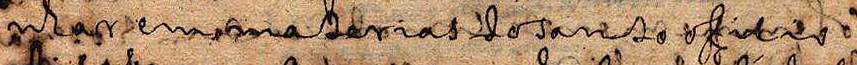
nhar em materias do santo officio
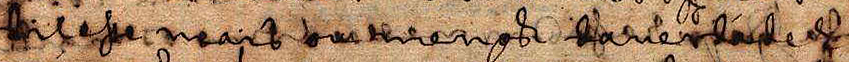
dicesse mais ou menos da uerdade E
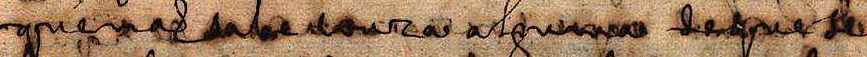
que naõ sabe couza alguma de que se
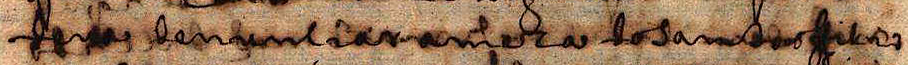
deua denunciar a meza do santo officio
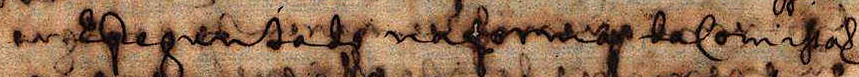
E preguntado na forma da Comissaõ
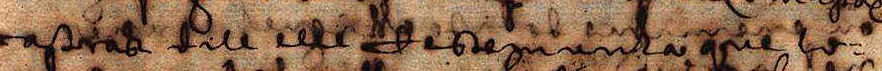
atras dice elle testemunha que co
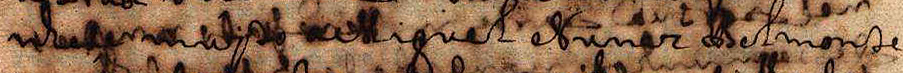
nhece mujto a Miguel Nunez Belmonte
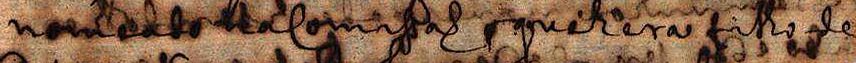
nomeado na Comissaõ o qual hera filho de
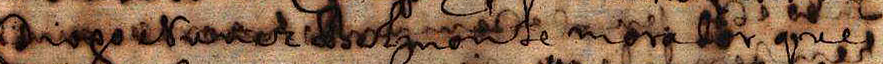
Diogo Nunez Belmonte morador que
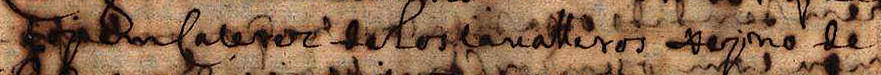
foj em Cacerez de los caualleros Rejno de
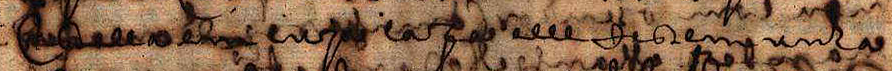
Castella em cuja caza elle testemunha
